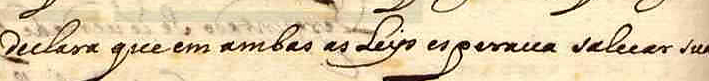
declara que em ambas as Leys esperaua saluar sua
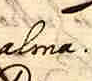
alma.
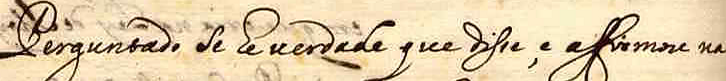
Perguntado se he verdade que disse, e affirmou na
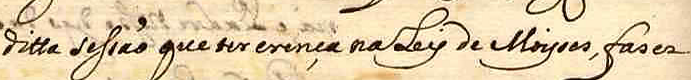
ditra sessão que ter crença na Ley de Moyses, faser
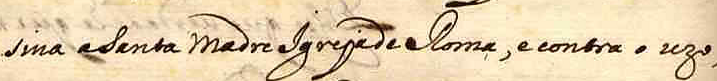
sina a Santa madre Jgreja de Roma, e contra o uzo
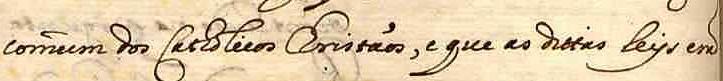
com̄um dos Catholicos Christãos, e que as dittas leys erã
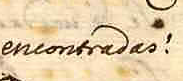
encontradas?
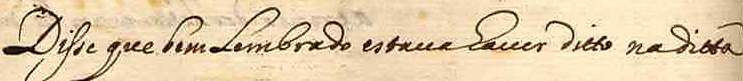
Disse que bem lembrado estaua hauer ditto na ditta
